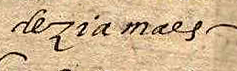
dezia maes
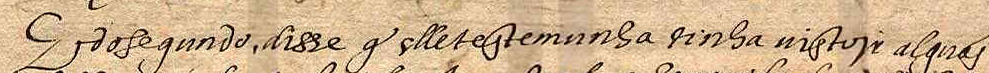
E do segundo, disse q̅ Elle testemunha tinha uisto jr alguās
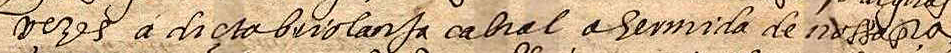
vezes a dicta briolanJa cabral a hermida de nossa s.ra
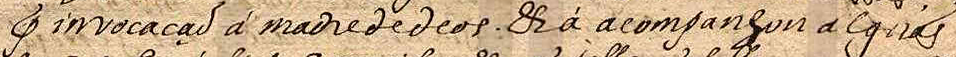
p̄ invocaçaõ à madre de deos. & à acompanhou alguas̄
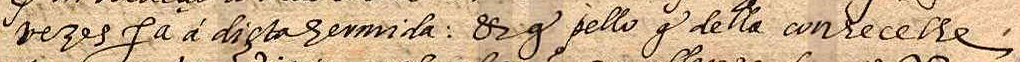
vezes ꝑa à dicta hermida: & q̄ pello q̄ della conhece lhe
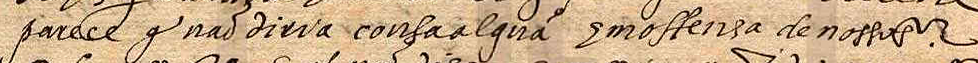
parece q̄ naõ diria cousa alguā Em offensa de nosso sor.
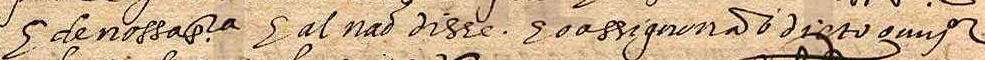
E de nossa s.ra E al naõ disse. E o assignou cō o dicto ouujor
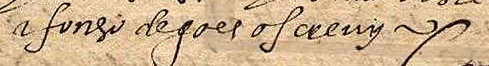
afonso de goes o screuy
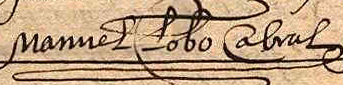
Manuel Lobo CabraL
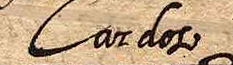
Cardoso
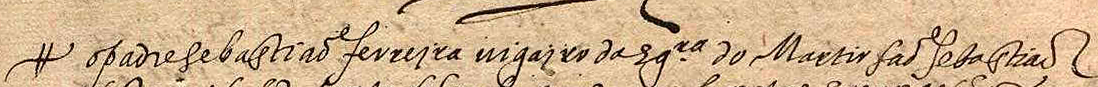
item o padre sebastiaõ ferrejra uigajro da Eg.ra do Martir saõ sebastiaõ
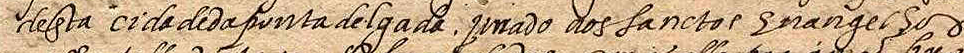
desta cidade da ponta delgada jurado dos sanctos Euangelhos
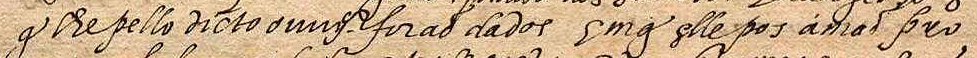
q̄ lhe pello dicto ouuyor foraõ dados Em q̄ elle pos a maõ pro
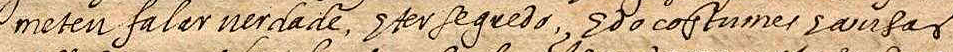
meteu falar uerdade, E ter segredo, E do costume E cousas
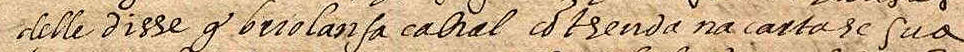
delle disse q̄ briolanja cabral cōtheuda na carta he sua
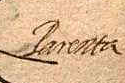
Parenta
